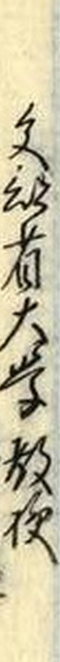文部省大学教授
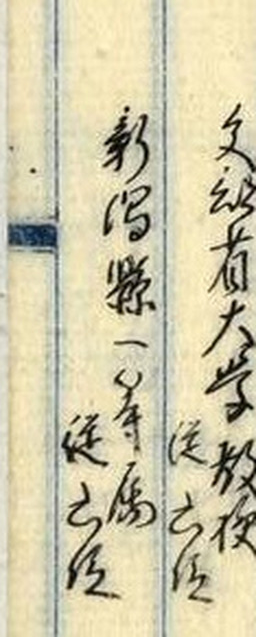新潟県一等属
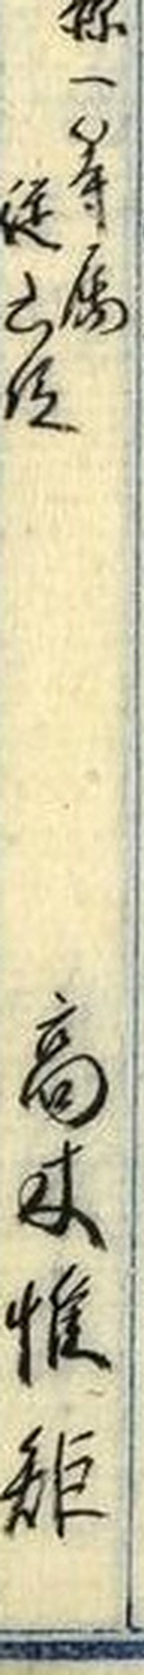従六位高木惟矩

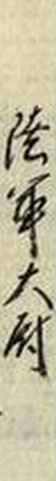陸軍大尉
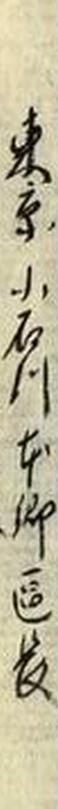東京小石川本郷区長
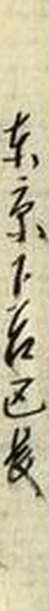東京下谷区長
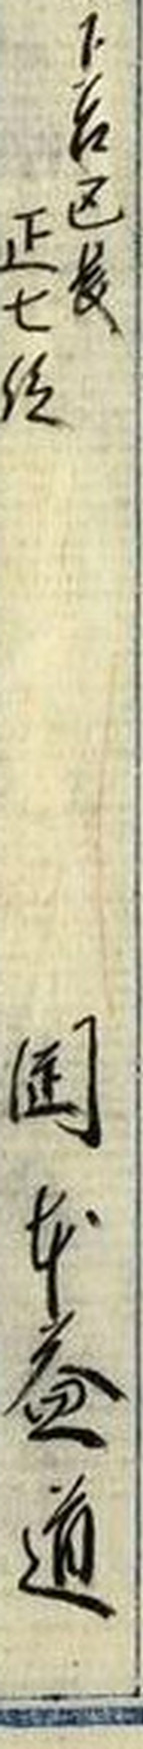正七位岡本益道
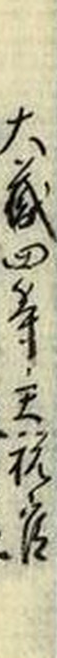大蔵四等主税官
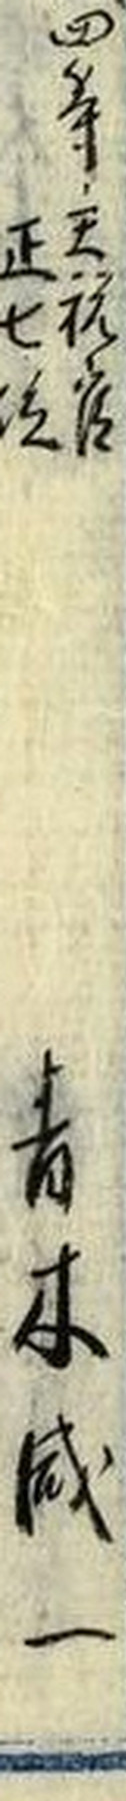正七位青木咸一
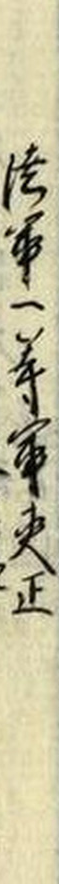陸軍一等軍吏正
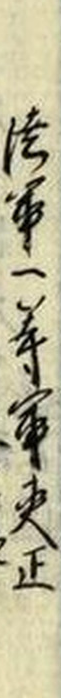陸軍一等軍吏正
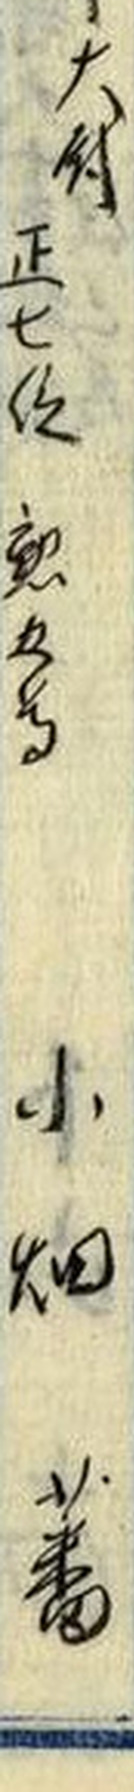正七位勲五等小幡蕃
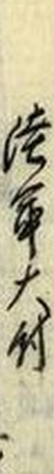陸軍大尉
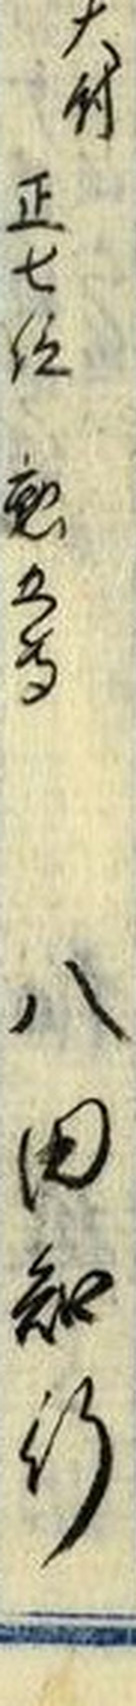正七位勲五等八田知行
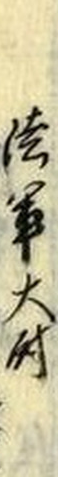陸軍大尉
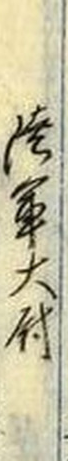陸軍大尉
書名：温古集 三巻
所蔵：福井県文書館 Fukui Prefectural Archives
